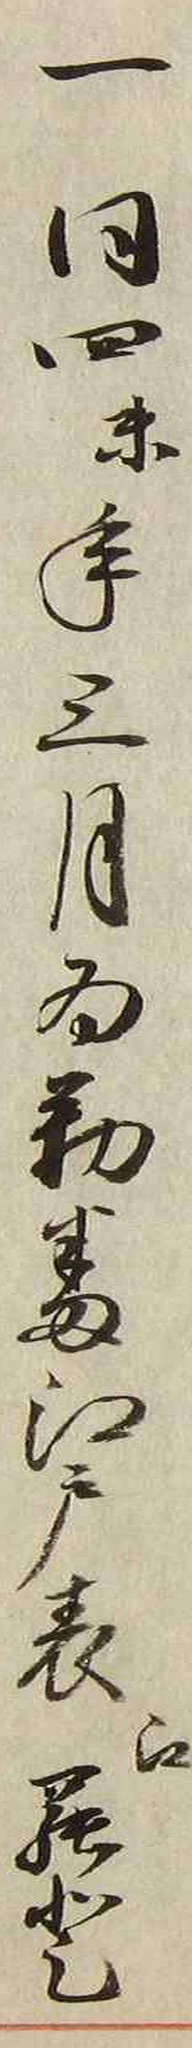一同四未年三月為勤番江戸表江罷登
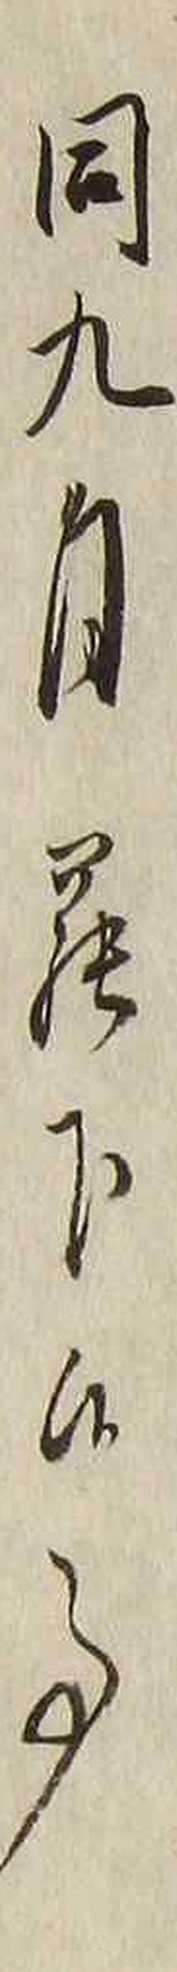同九月罷下候事

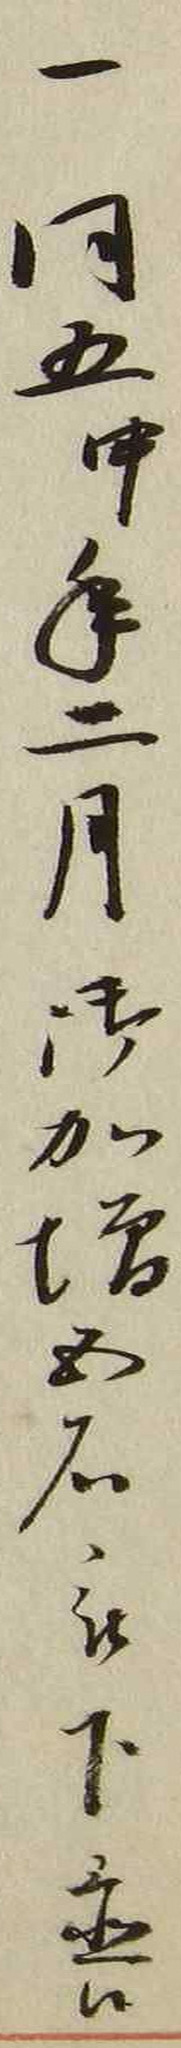一同五申年二月御加増五石被下置候
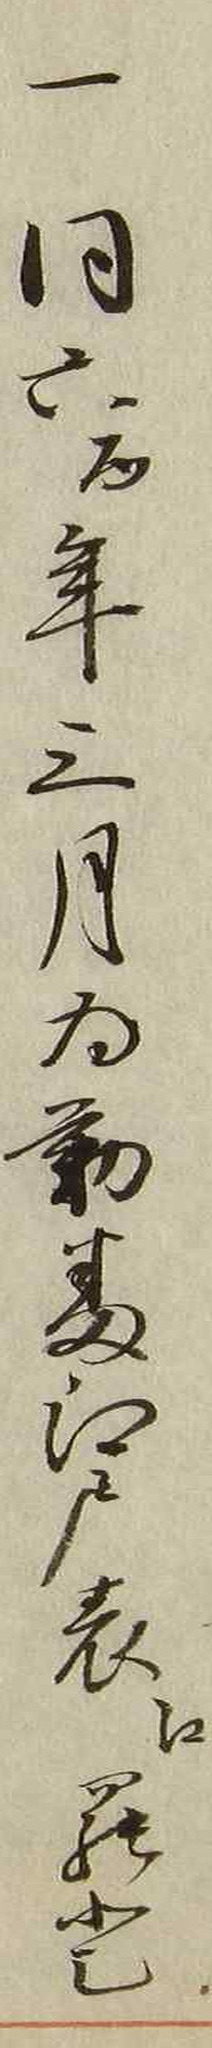一同六酉年三月為勤番江戸表江罷登
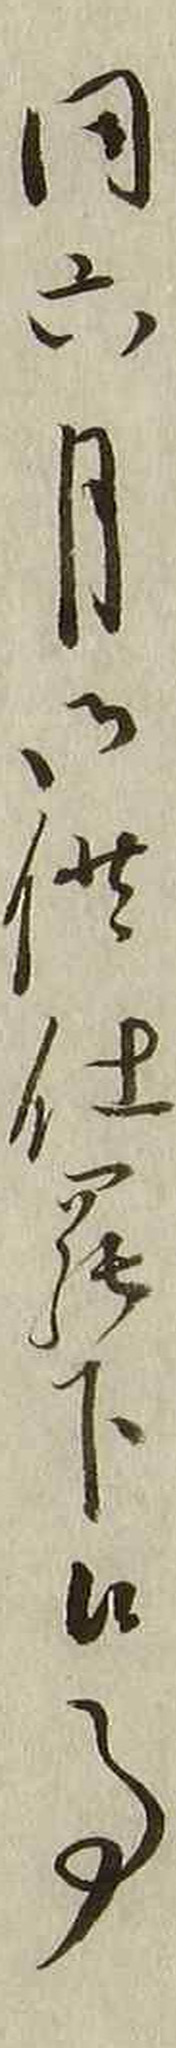同六月御供仕罷下候事
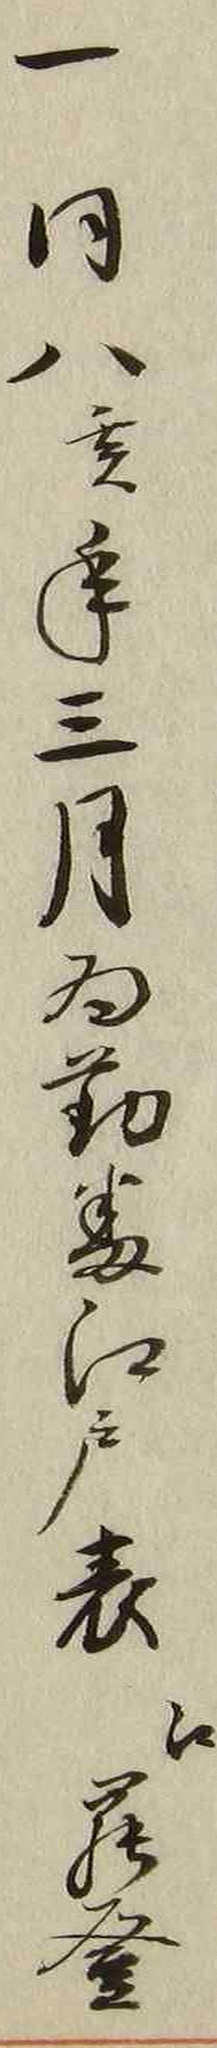一同八亥年三月為勤番江戸表江罷登
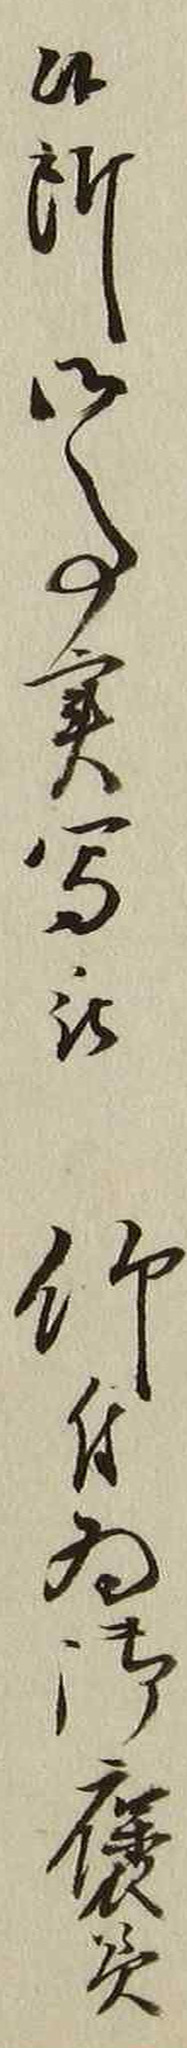候所御事実写被仰付為御褒美
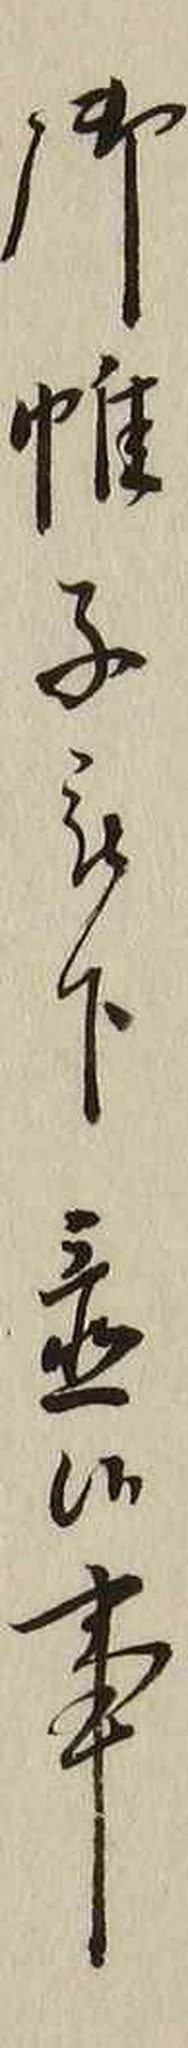御帷子被下置候事
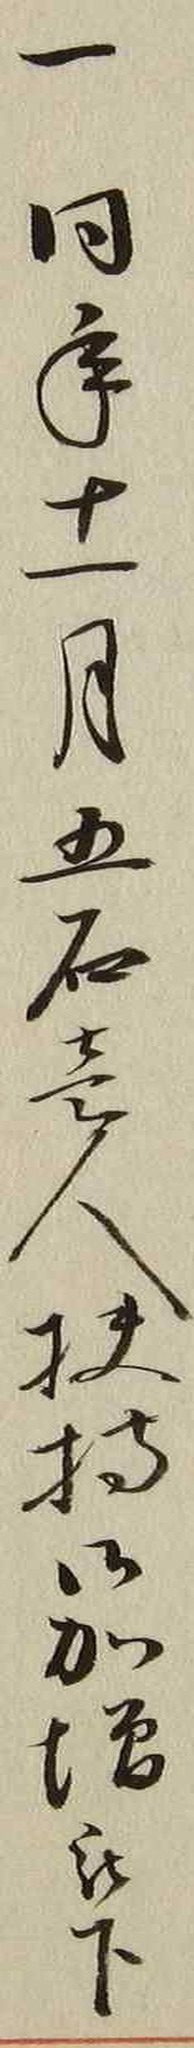一同年十一月五石壱人扶持御加増被下
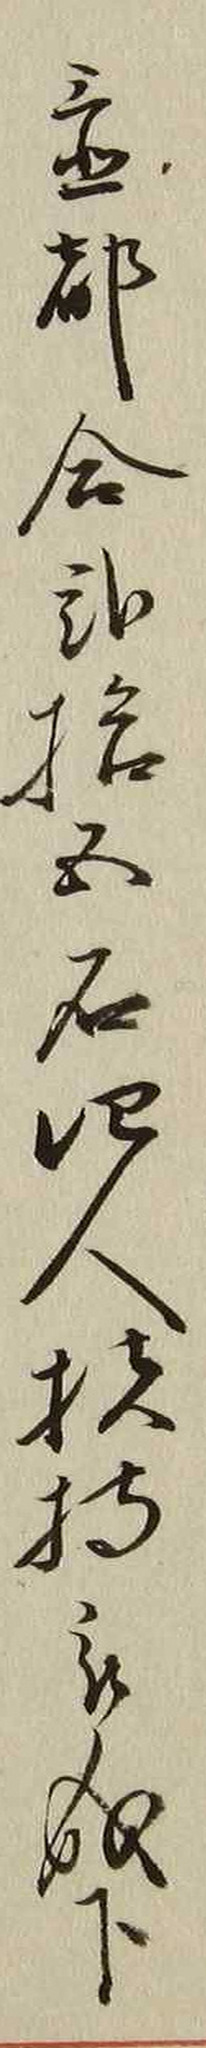置都合弐拾五石四人扶持被成下
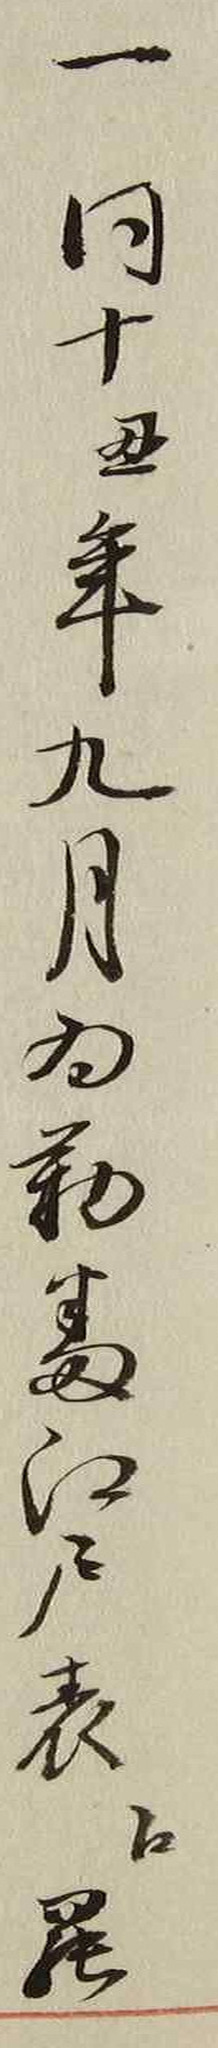一同十丑年九月為勤番江戸表江罷
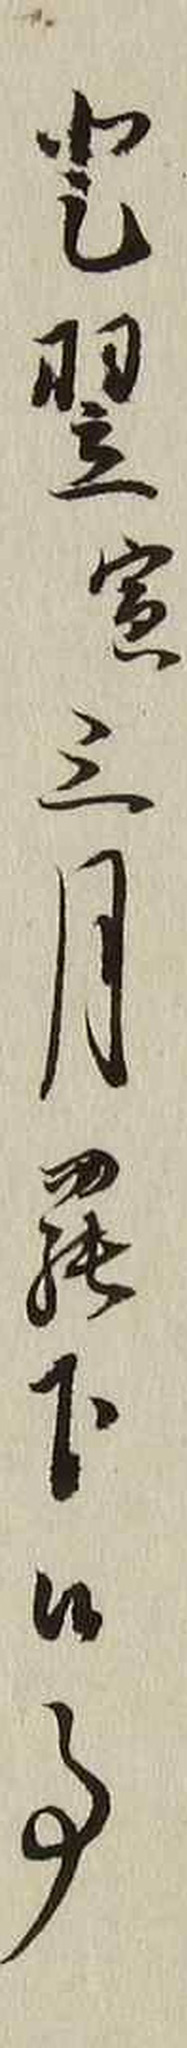登翌寅三月罷下候事
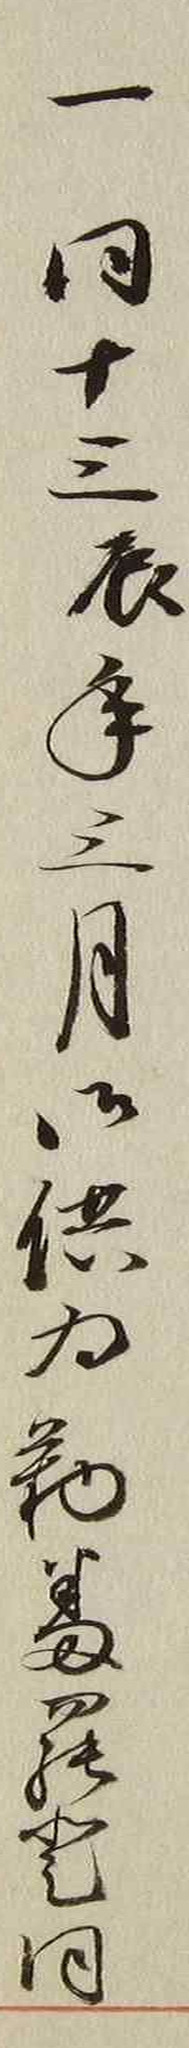一同十三辰年三月御供為勤番罷登同
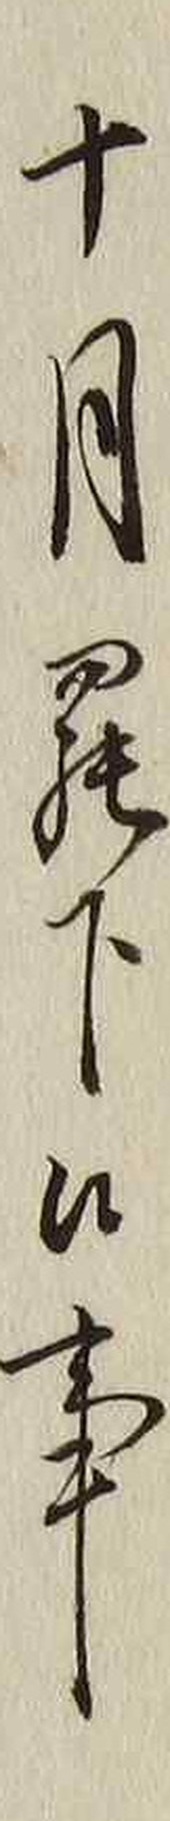十月罷下候事
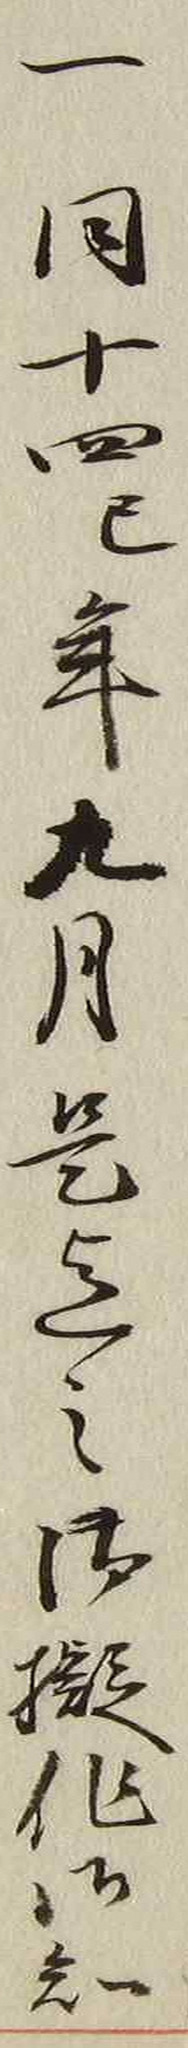一同十四巳年九月是迄之御擬作御知
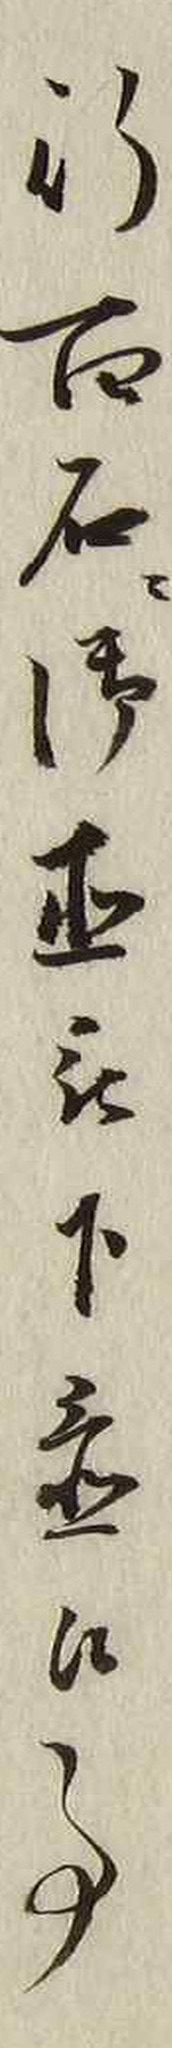行百石ニ御直被下置候事
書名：諸士系譜　巻之22　い之部22
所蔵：会津若松市立会津図書館
